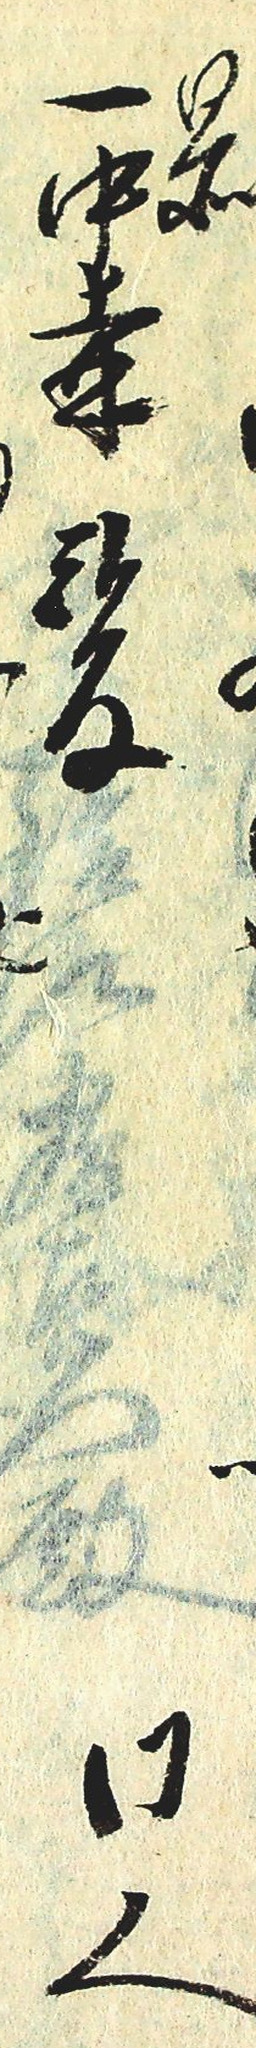一中上林弐反同人
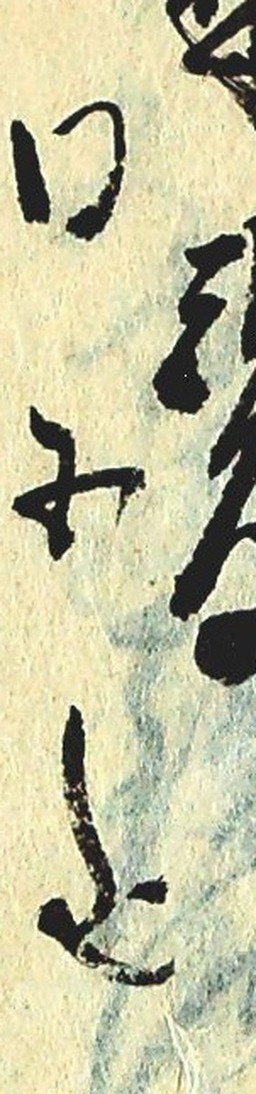同五匁
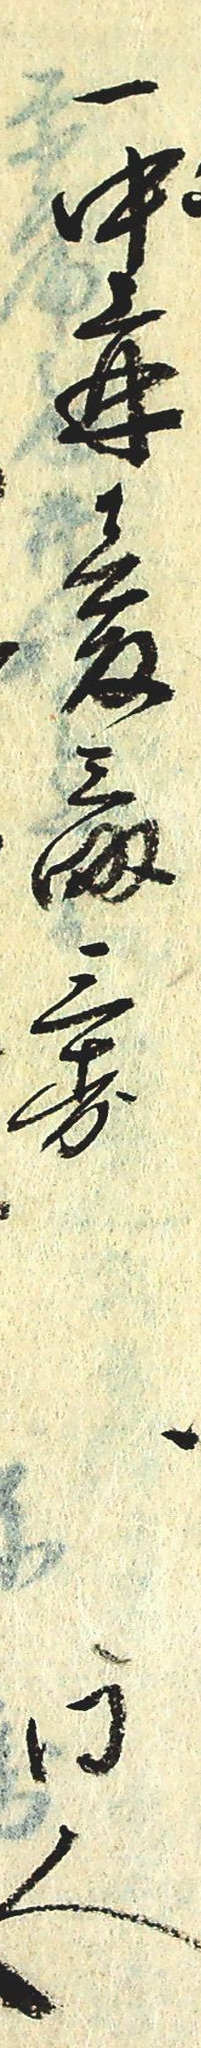一中上林壱反三畝三分同人
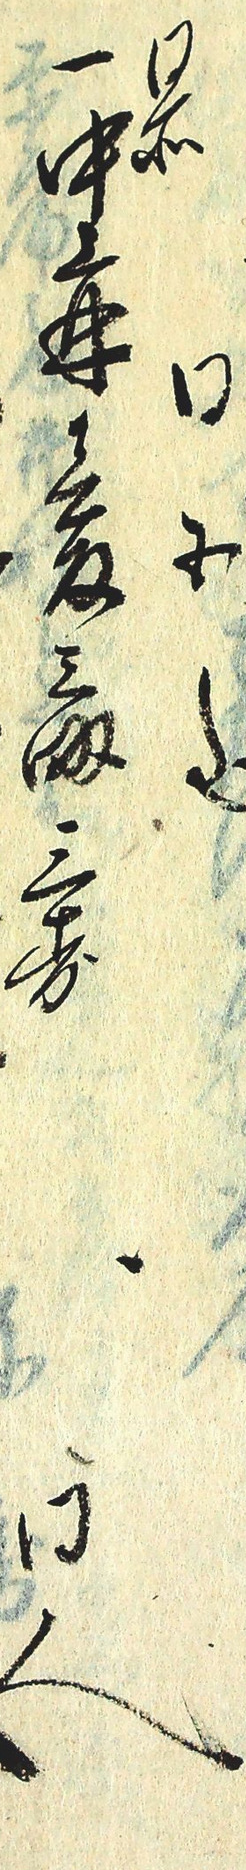一中上林壱反三畝三分同人
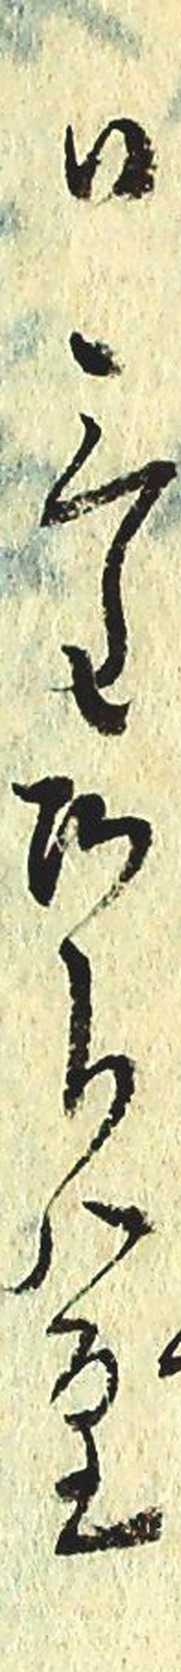同三匁弐分八厘
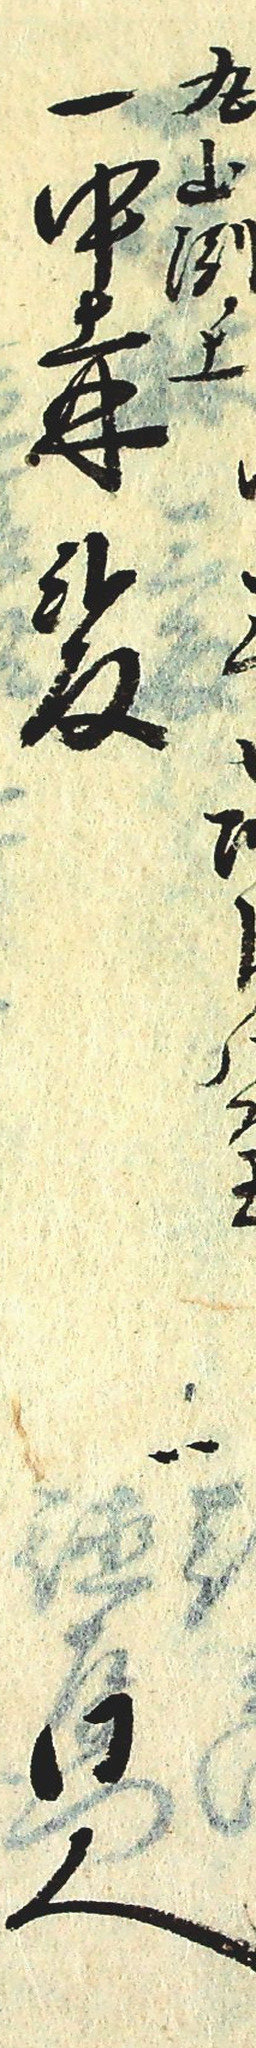一中上林弐反同人
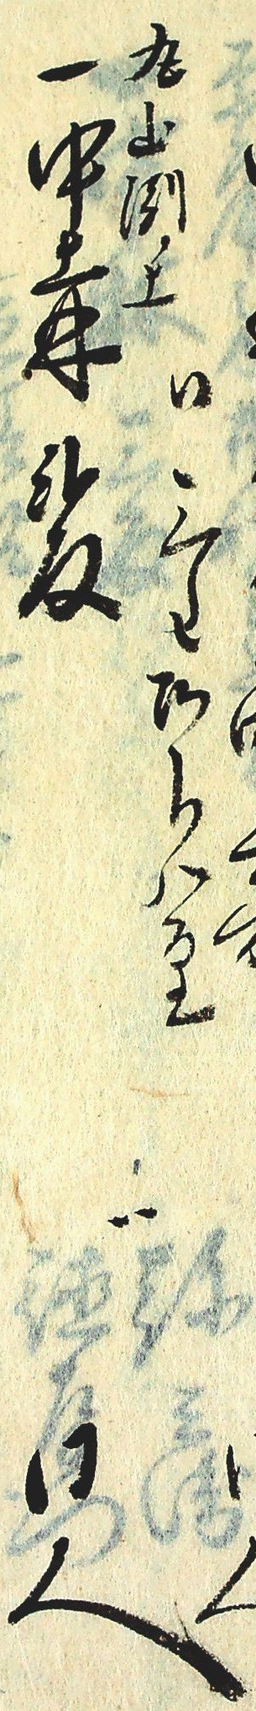一中上林弐反同人
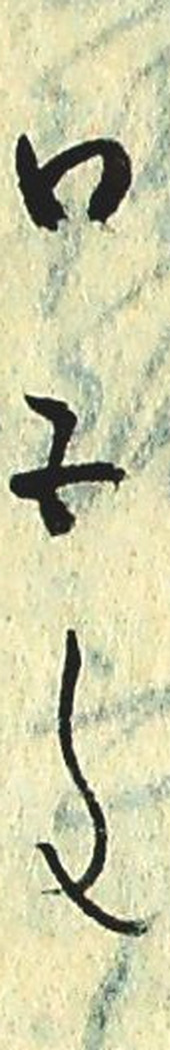同五匁
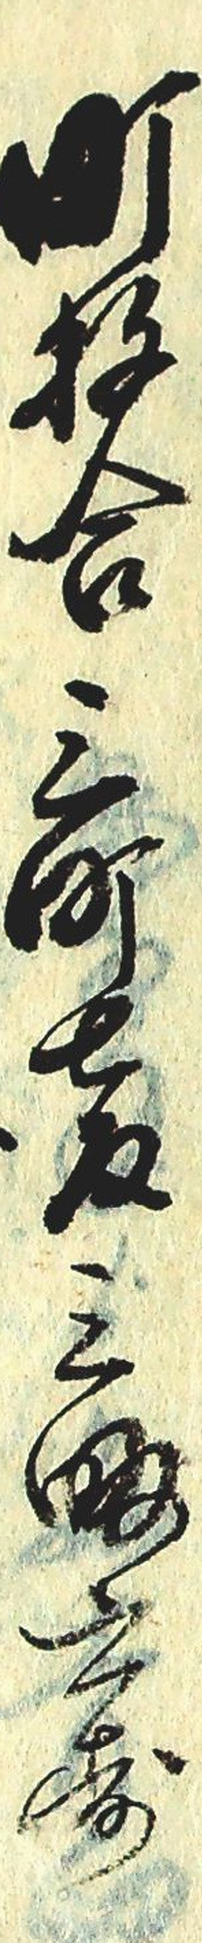町数合三町七反三畝六歩
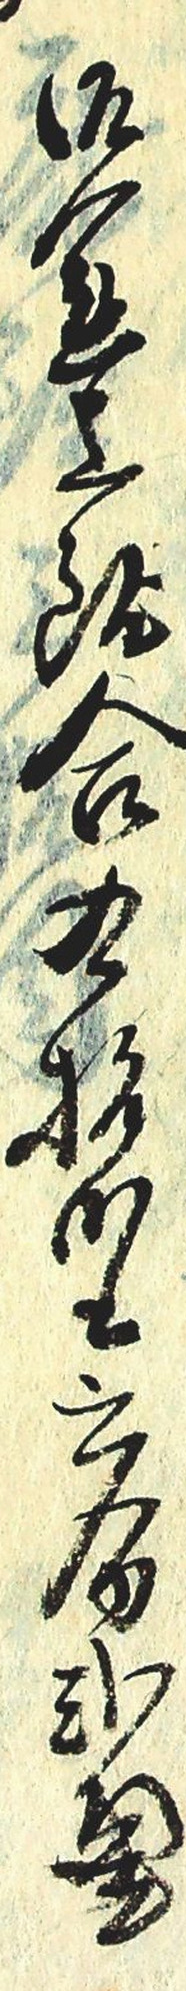御運上銀合九拾弐匁六分弐厘

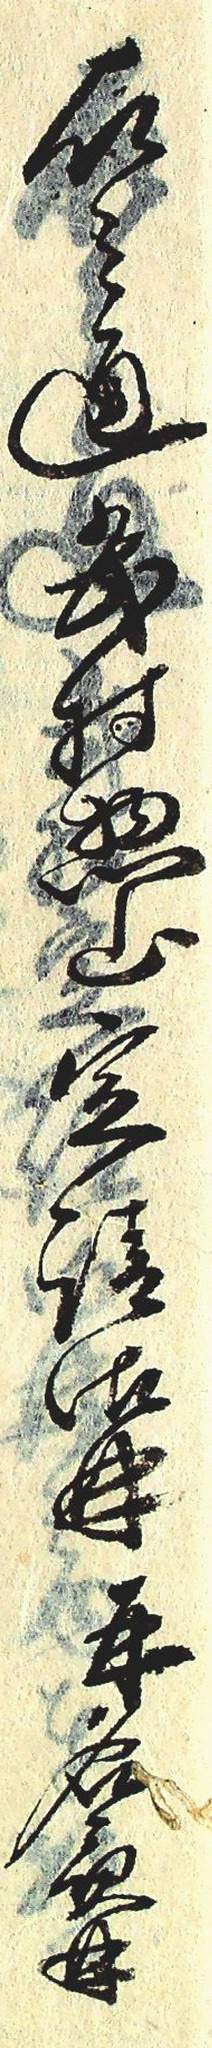右之通当村惣山定請御林并名負林
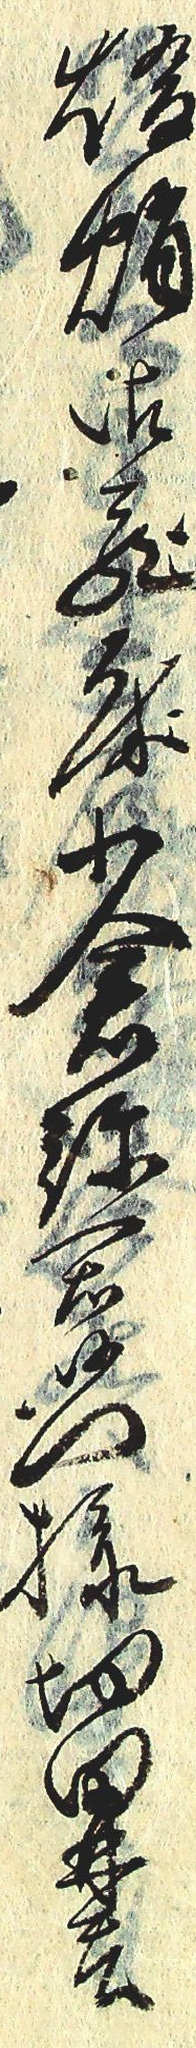焔硝御蔵床小倉弥一右衛門様切田林共
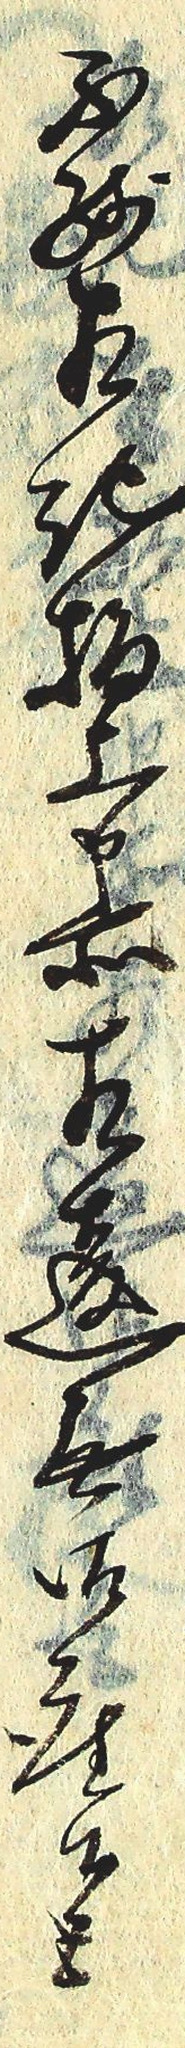不残相記指上申所相違無御座候以上
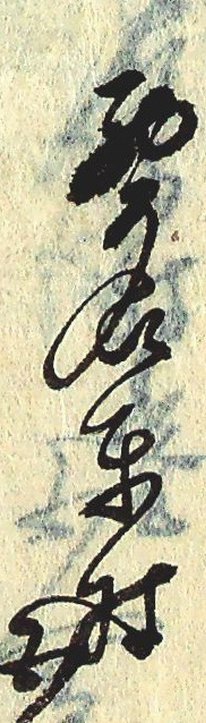西名東村
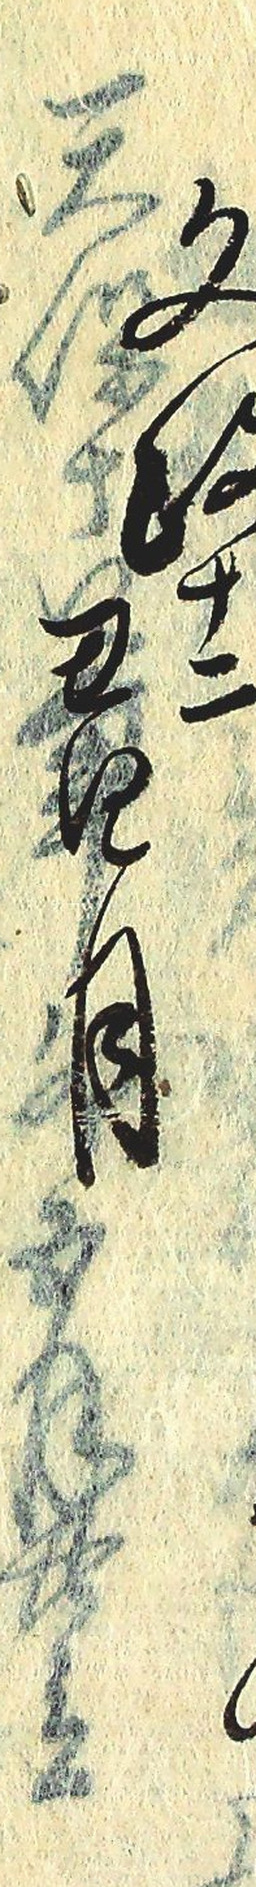丑四月
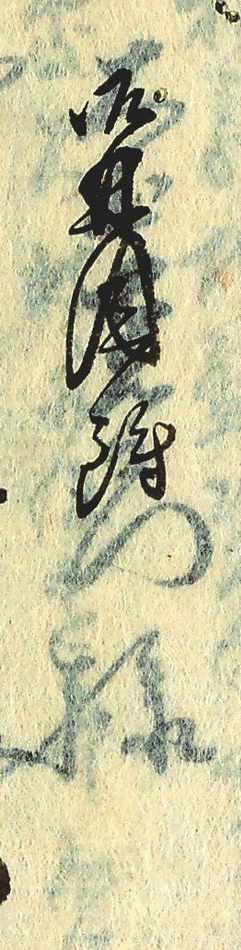御林目附
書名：諸御願書控(弐番）
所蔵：鳴門教育大学 Naruto University of Education
